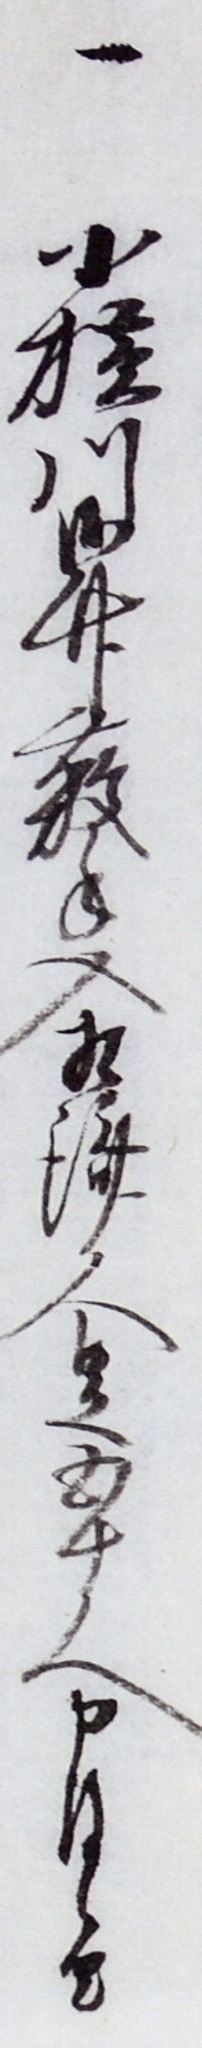一小横川御竹藪手入相済人足五十人申付候由
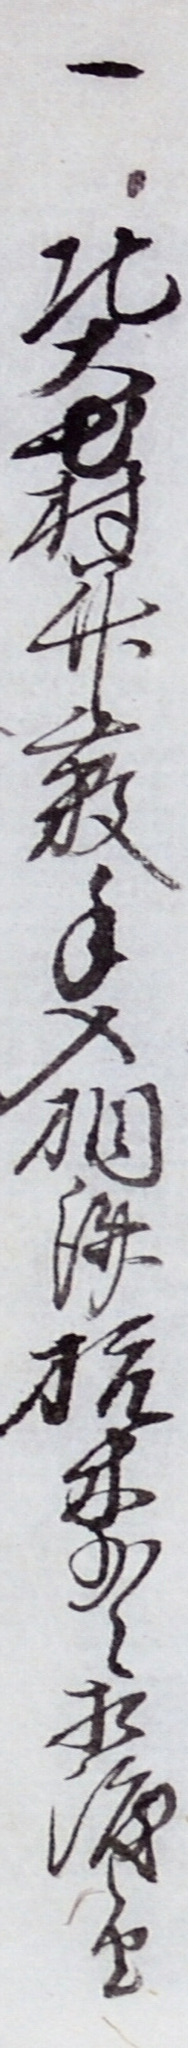一北大出村御竹藪手入相済杭木少々相渡候由
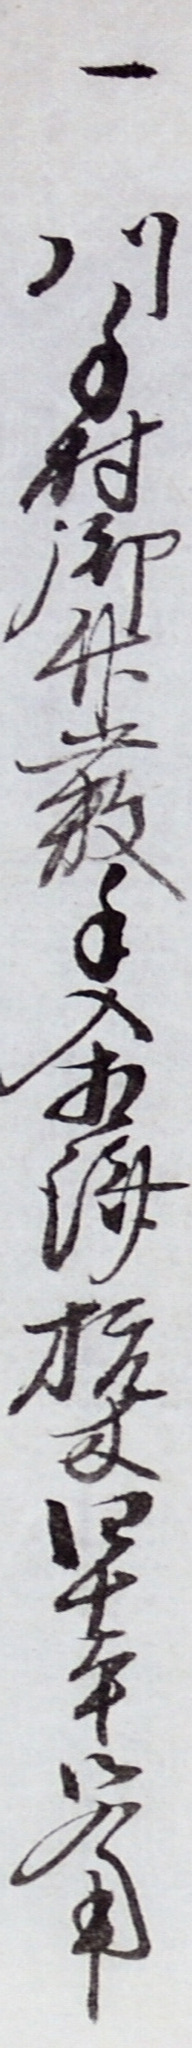一川手村御竹藪手入相済杭木四十本御入用
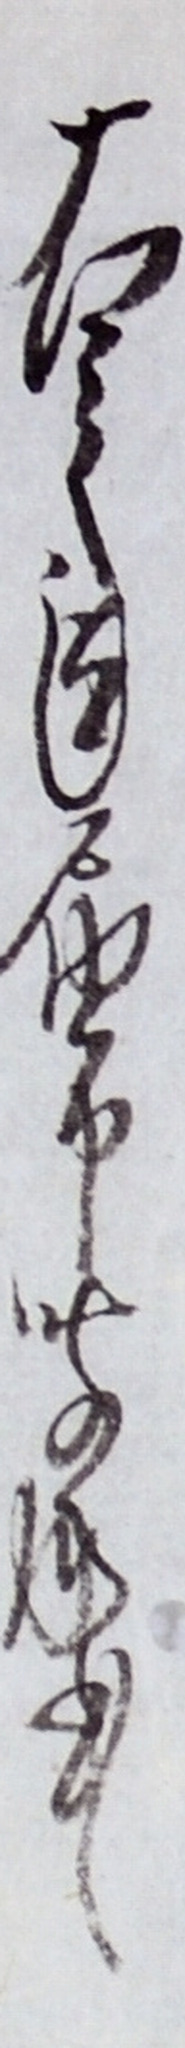右之趣届申聞承置候
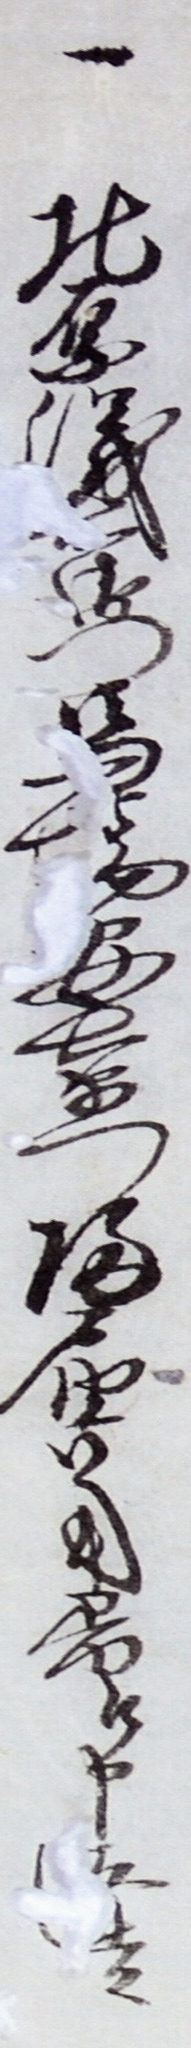一北原儀右衛門馬場安右衛門帰届御用番江申候
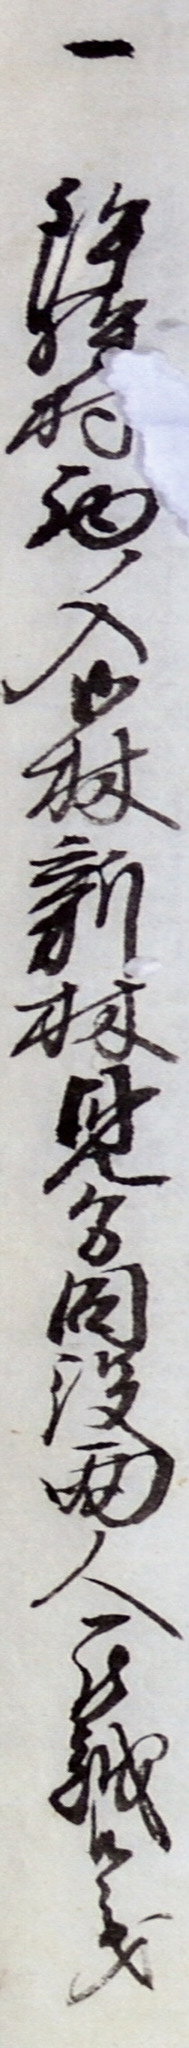一鉾持村西ノ入御林新林見分同役両人罷越候義

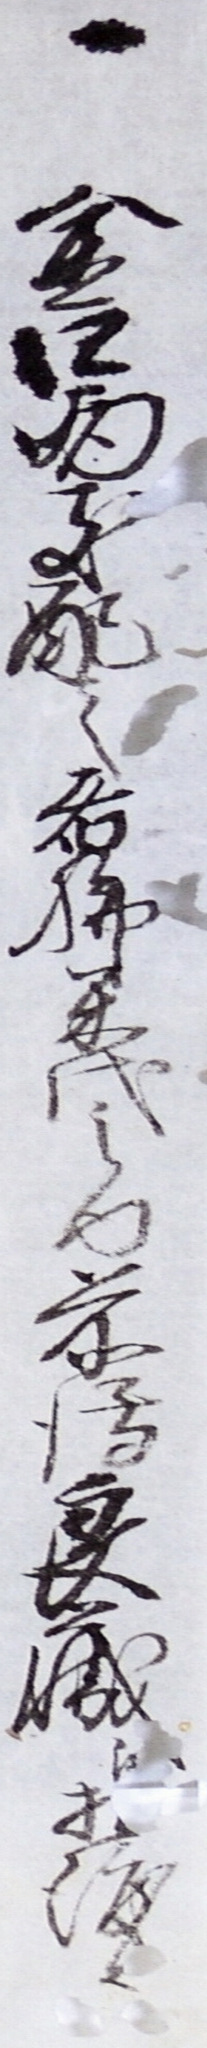一金四両支配之者払米代之内前借良蔵江相渡候
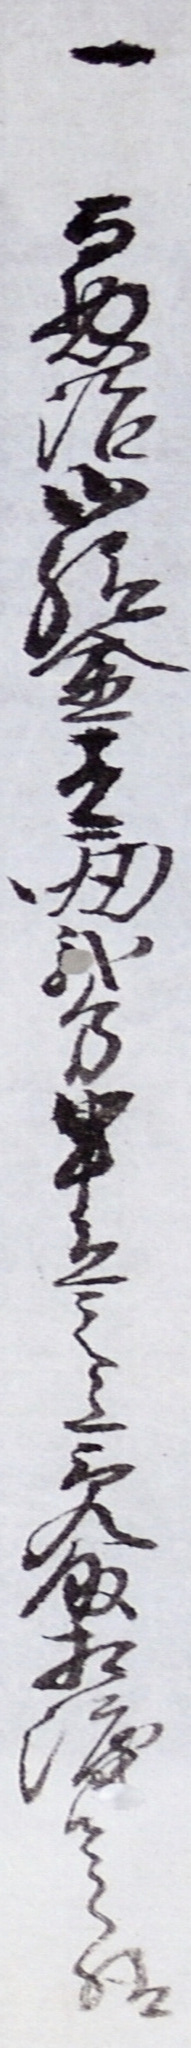一与惣治御給金壱両弐分申立之上受取相渡候之様
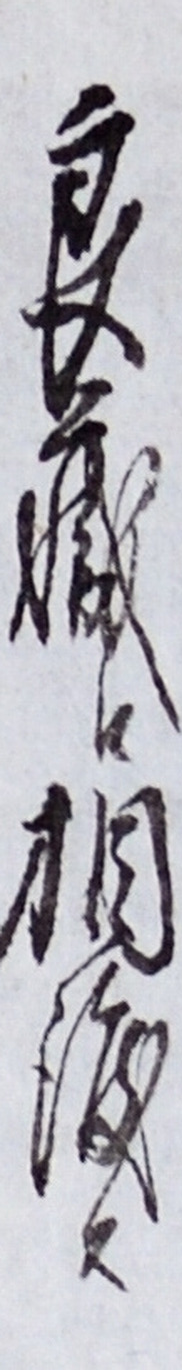良蔵江相渡候
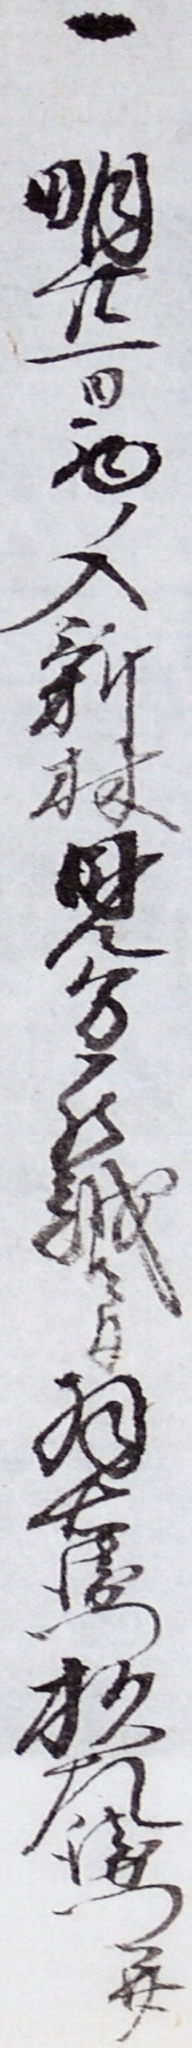一明廿一日西ノ入新林見分罷越候ニ付羽右衛門杉左衛門并
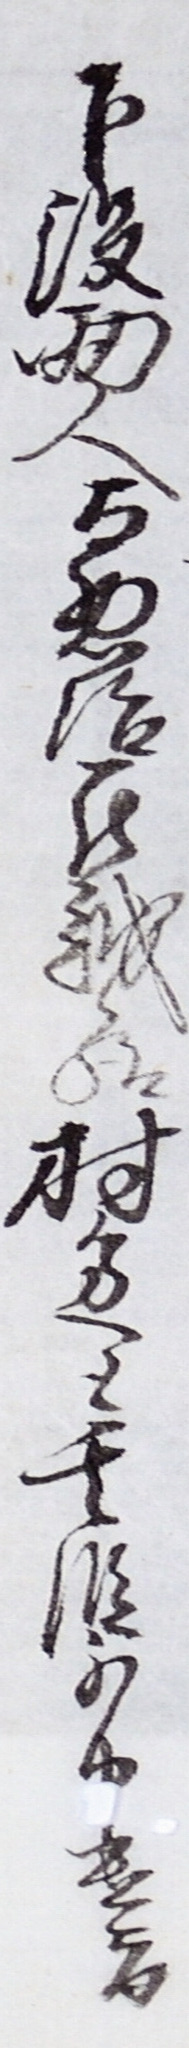下役両人与惣治罷越候様村方へも其段可申遣旨
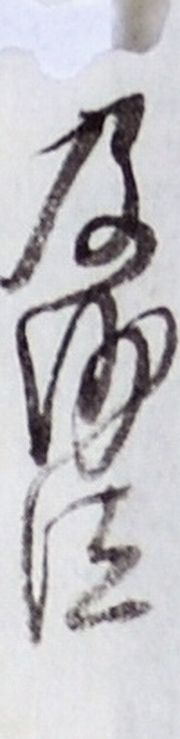及沙汰
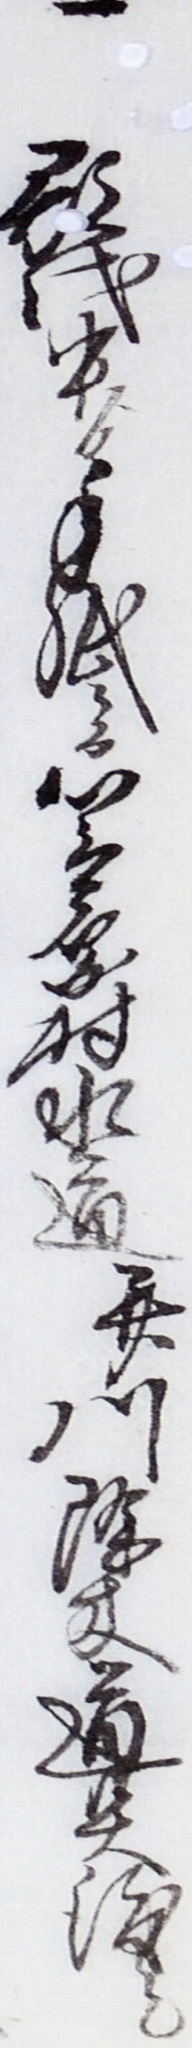一郡代中ゟ手紙ニ而笠原村水道并川除木道具渡し
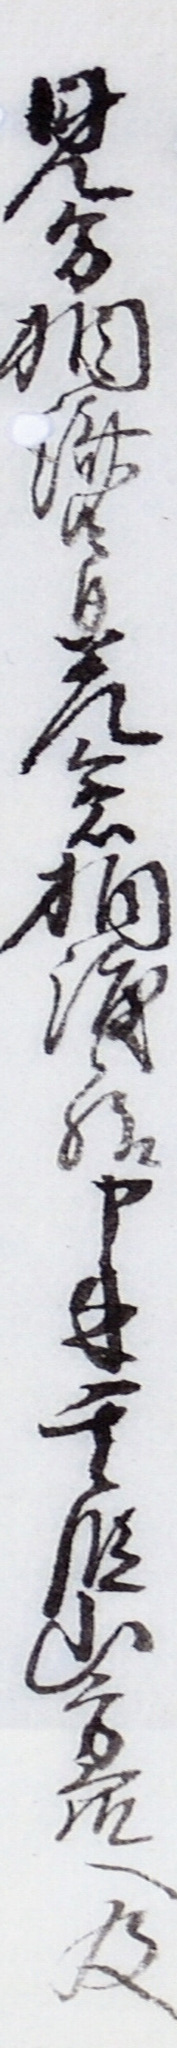見分相済候ニ付差急相渡候様申来其段山方衆へ及
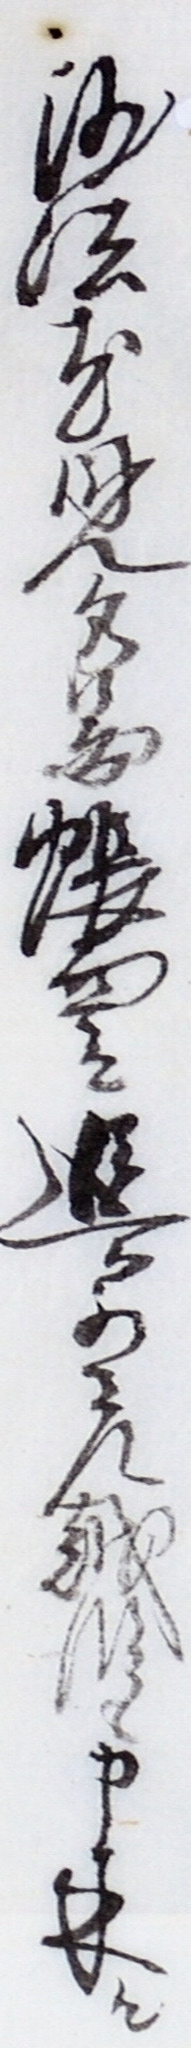沙汰尤見分図帳面は追而可差越段と申来候
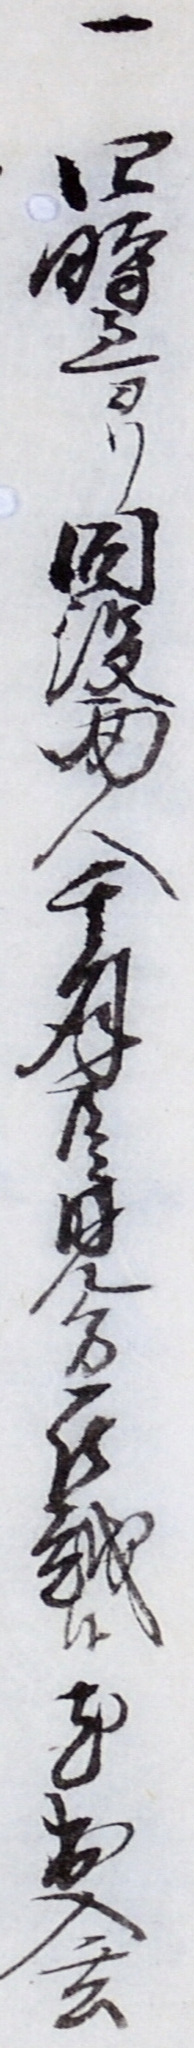一四時過より同役両人其外共々見分罷越候尤出入共
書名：御山奉行御用控
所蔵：伊那市立高遠町図書館・合同会社AMANE
